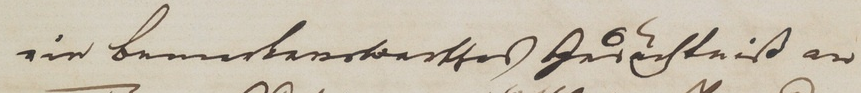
ein bemerkenswerthes Gedächtniß an
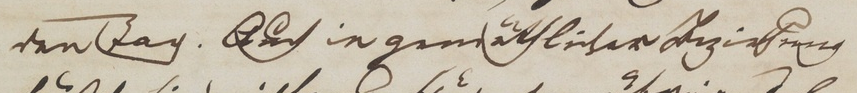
den Tag. Auch in gemüthlicher Beziehung
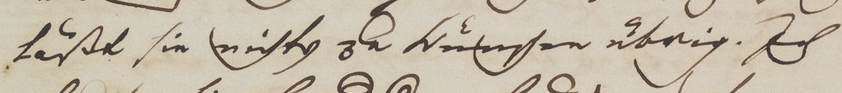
läßt sie nichts zu wünschen übrig. Ich
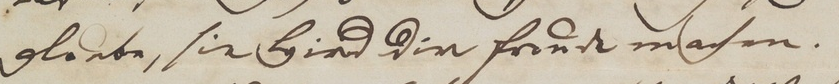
glaube, sie wird dir Freude machen.
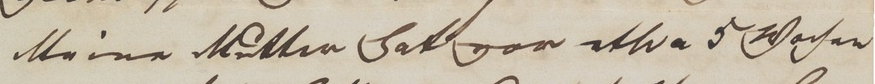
Meine Mutter hat vor etwa 5 Wochen
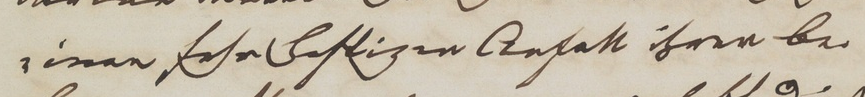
einen sehr heftigen Anfall ihrer be-
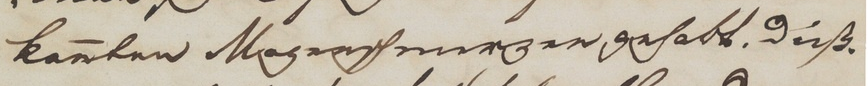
kannten Magenschmerzen gehabt. Dieß-
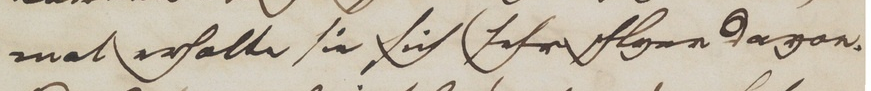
mal erholte sie sich sehr schwer davon.
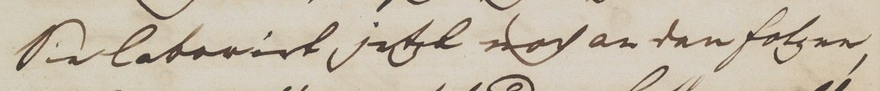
Sie laborirt jetzt noch an den Folgen,
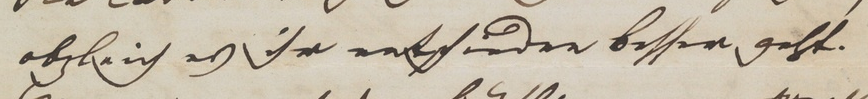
obgleich es ihr entschieden besser geht.
